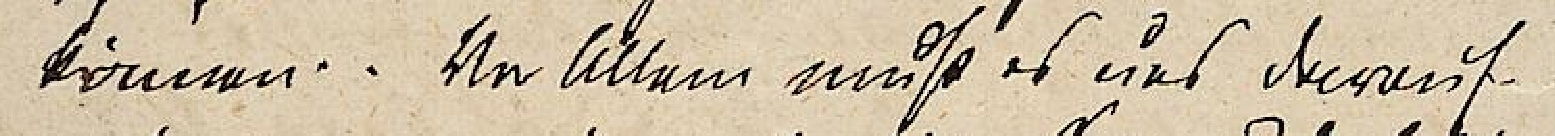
können.. Vn Allem muß es uns darauf
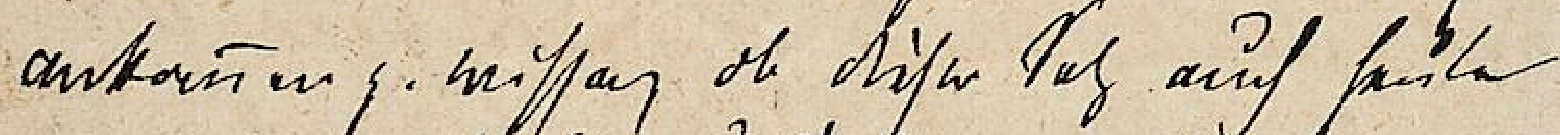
ankomen z. wissen, ob dieser Satz auch heute
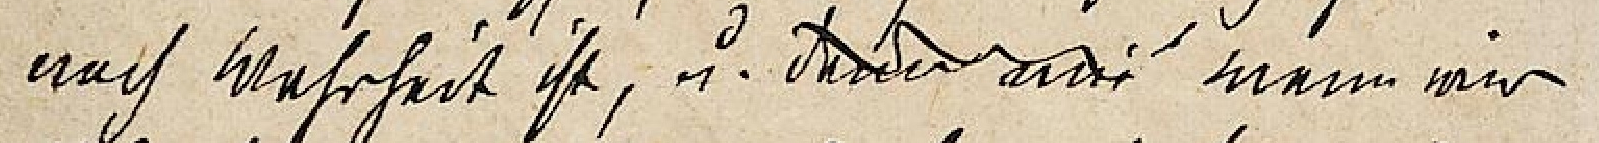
noch Wahrheit ist, u. dem wir wenn wir
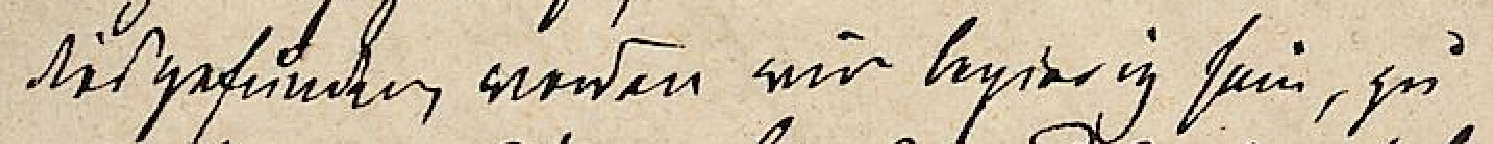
dies gefunden, werden wir begierig sein, zu
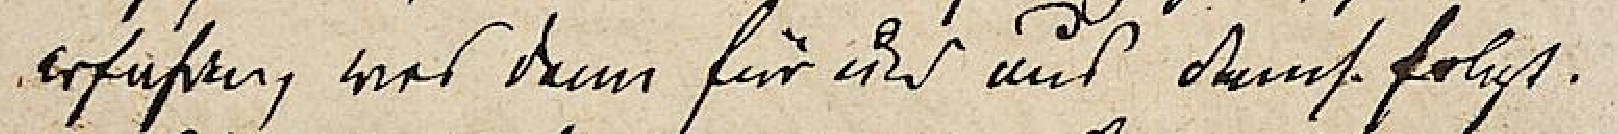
erfahren, was denn für uns aus dems. folgt.
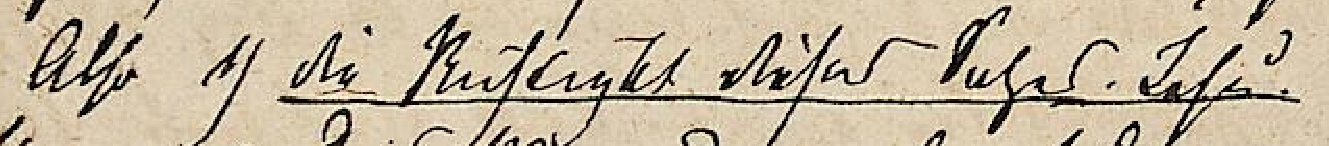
Also 1) die Richtigkeit dieses Satzes Jesu.
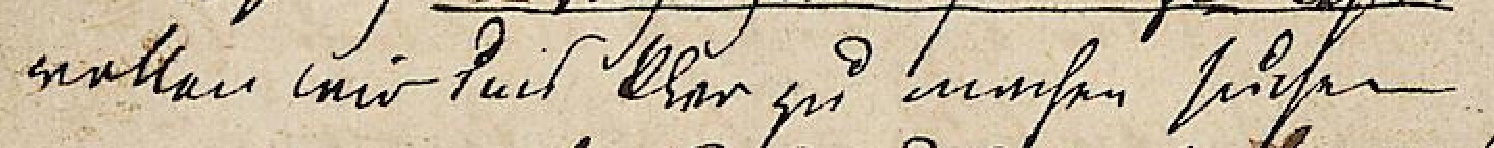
wollen wir uns klar zu machen suchen
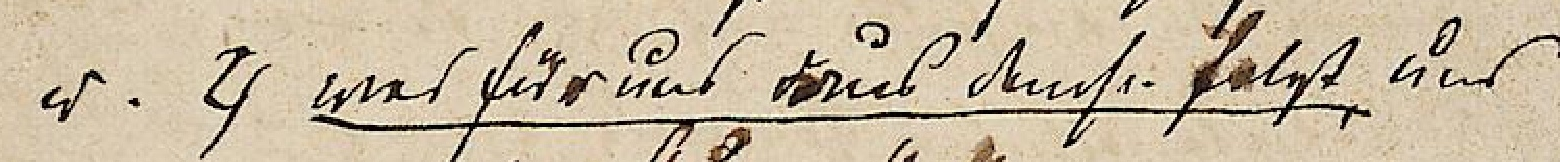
u. 2) was für uns aus dems. folgt uns
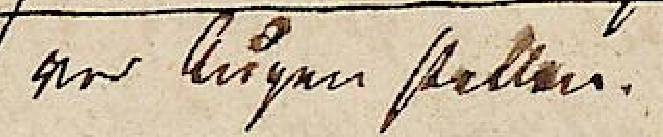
vor Augen stellen
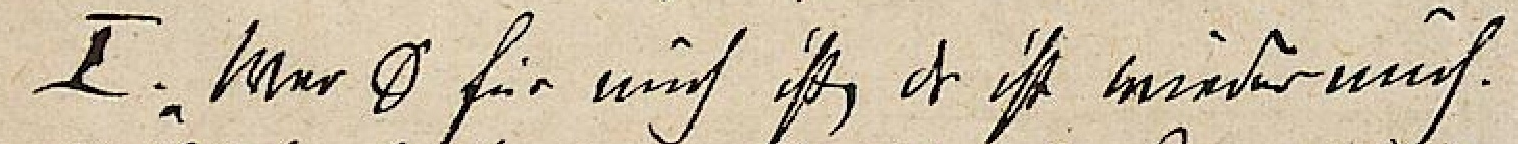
I. "Wer o für mich ist, dr ist wider mich."
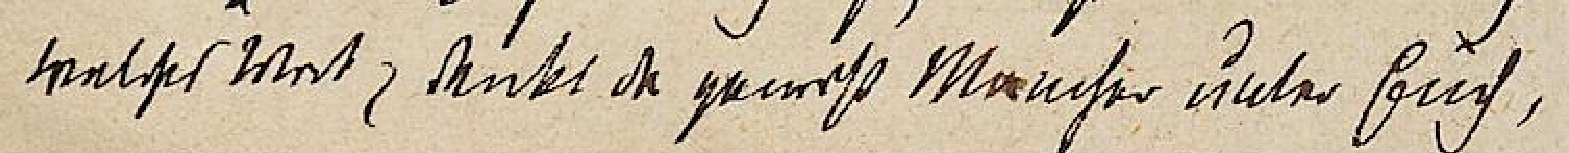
welches Wort, denk da gewiss Mancher unter Euch,
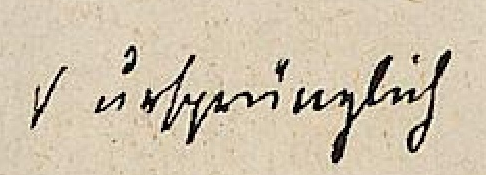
V ursprünglich
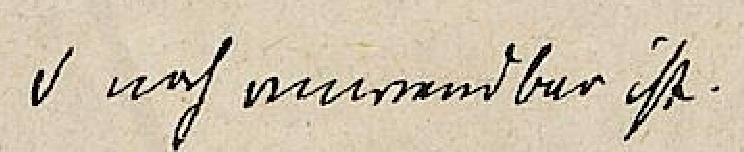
V noch anwendbar ist.
